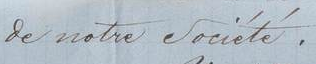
de notre Société.
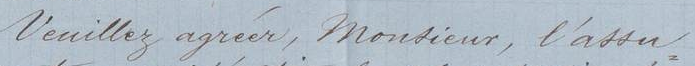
Veuillez agréer, Monsieur, l'assu-
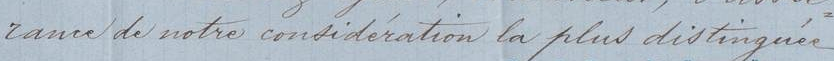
rance de notre considération la plus distinguée.
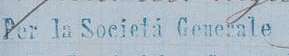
Per la Società Generale
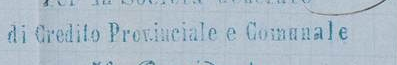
di Credito Provinciale e Comunale
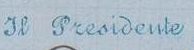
Il Presidente
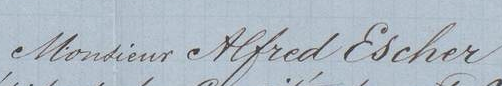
Monsieur Alfred Escher
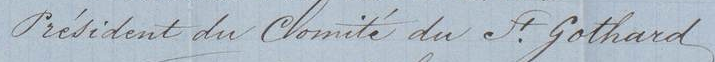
Président du Comité du St Gothard
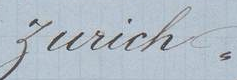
Zurich.
